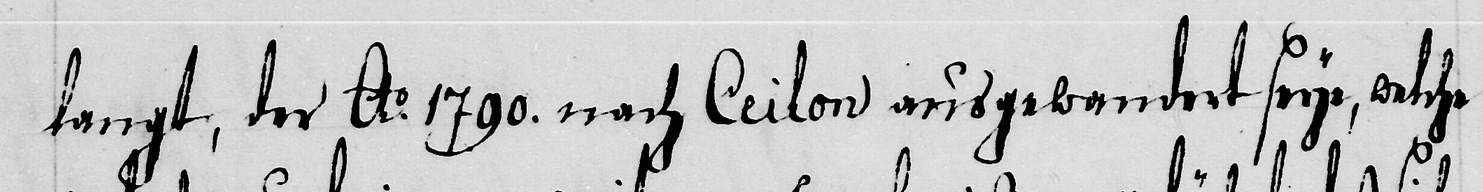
langt, der Ao. 1790. nach Ceilon ausgewandert seye, welche
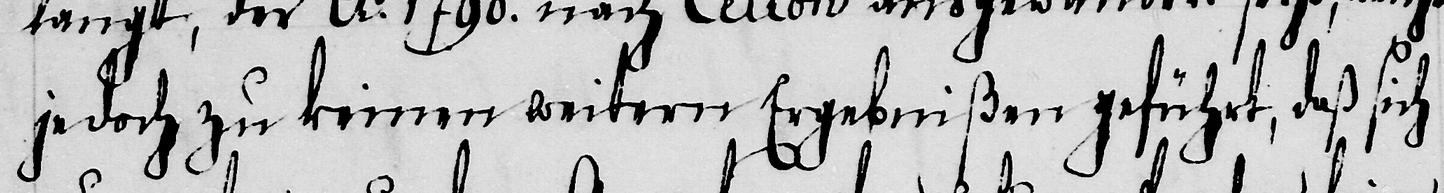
jedoch zu keinen weitern Ergebnißen geführt, daß sich
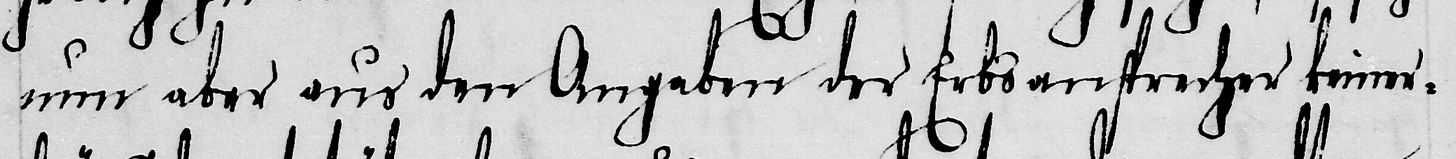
nun aber aus den Angaben der Erbsansprecher keiner¬
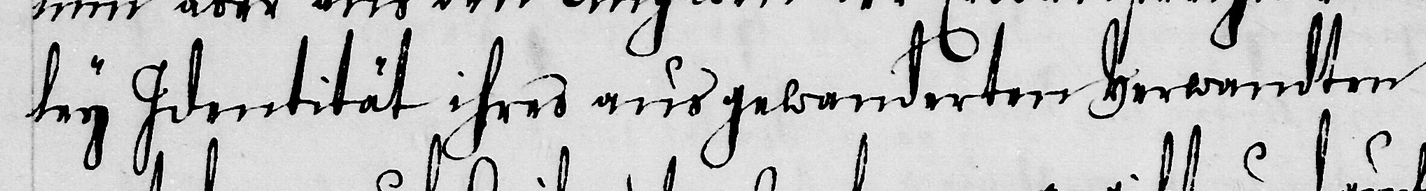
ley Identität ihres ausgewanderten Verwandten
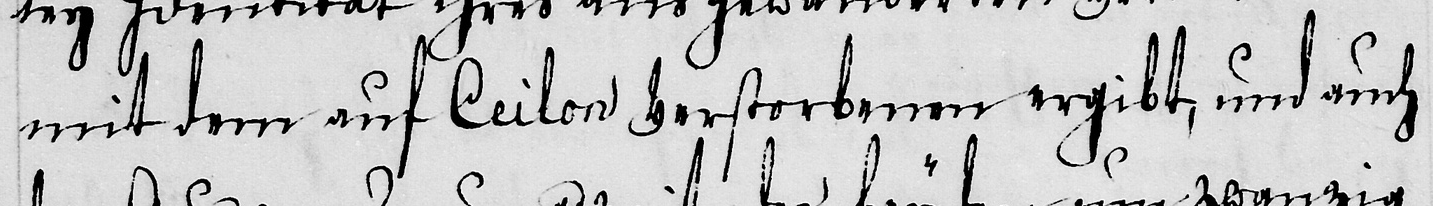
mit dem auf Ceilon verstorbenen ergibt, und auch
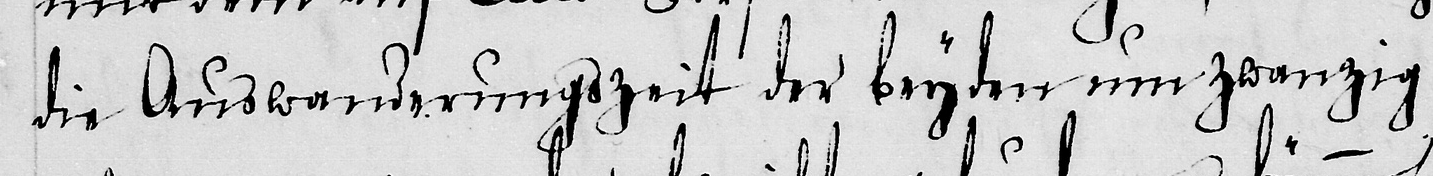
die Auswanderungszeit der beyden um zwanzig
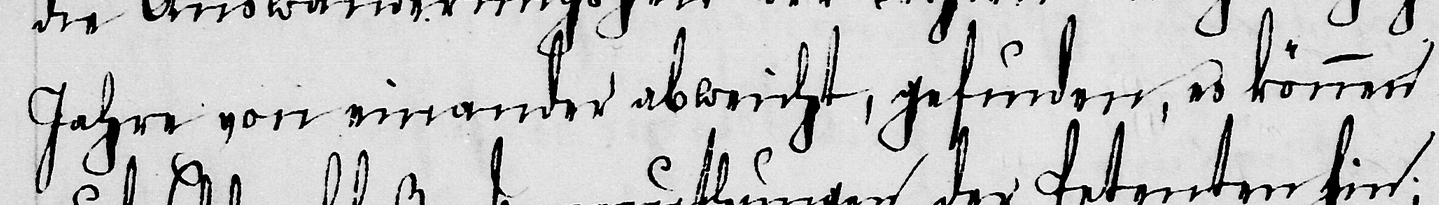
Jahre von einander abweicht, gefunden, es können
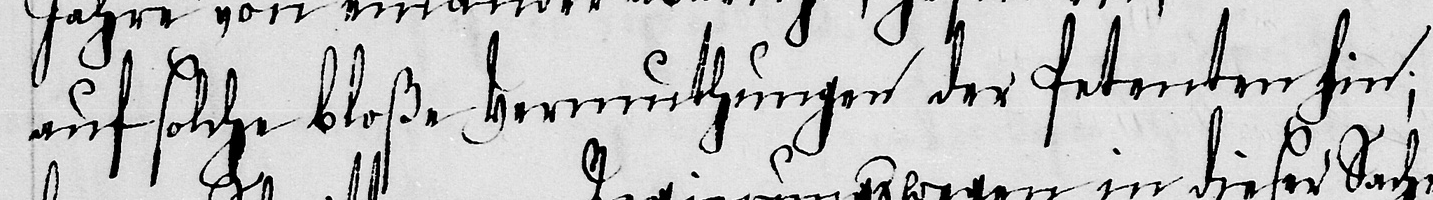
auf solche bloße Vermuthungen der Petenten hin,
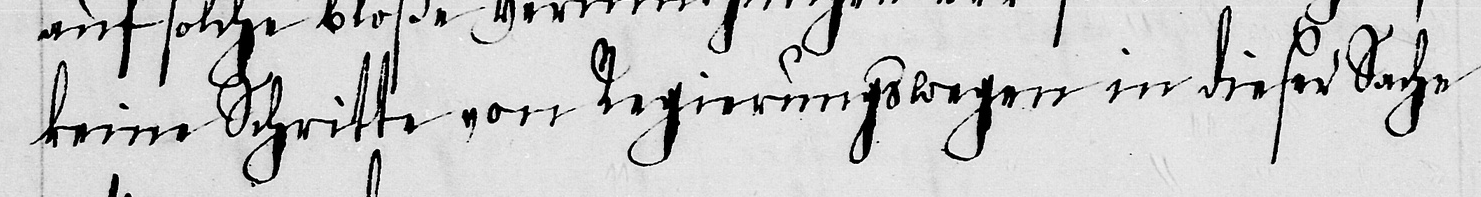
keine Schritte von Regierungswegen in dieser Sache
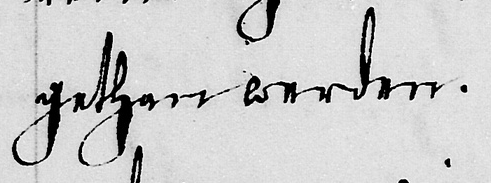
gethan werden.
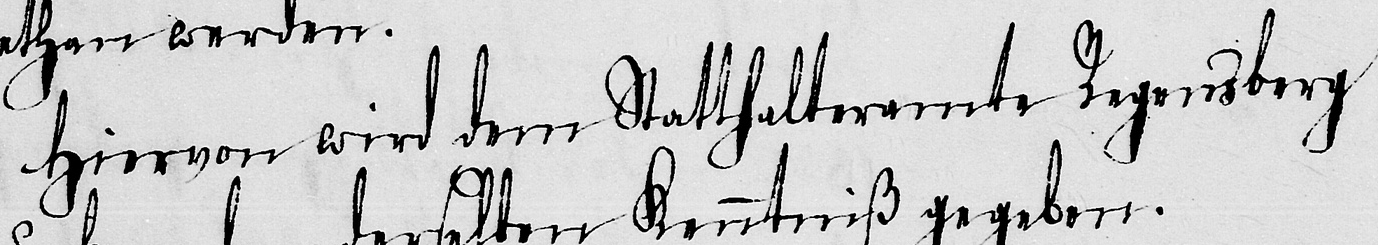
Hiervon wird dem Statthalteramte Regensberg
